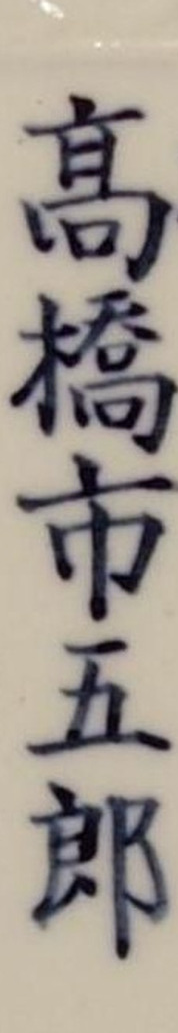高橋市五郎
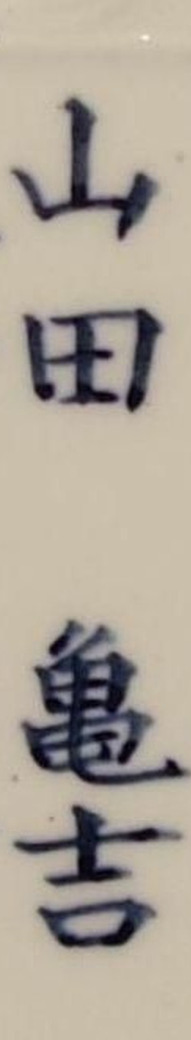山田亀吉
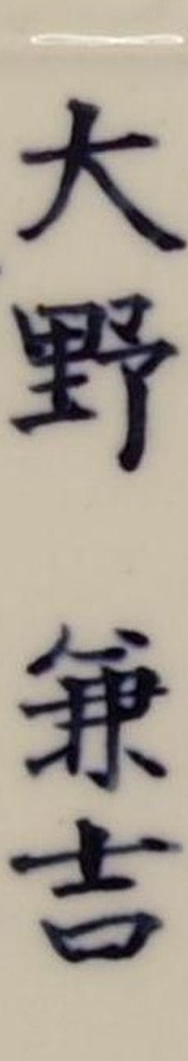大野兼吉
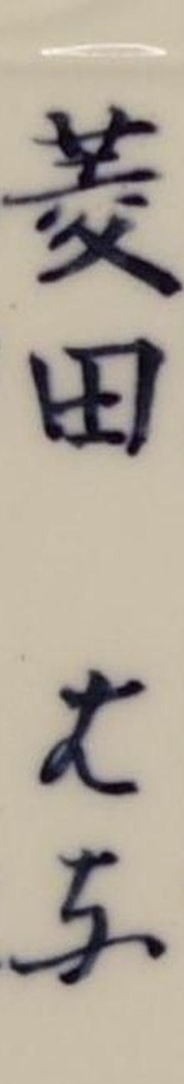菱田はな
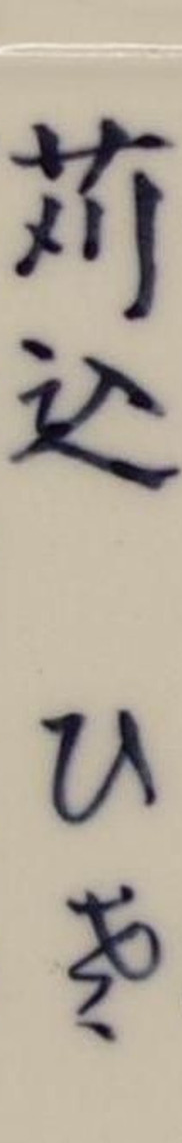苅込ひさ
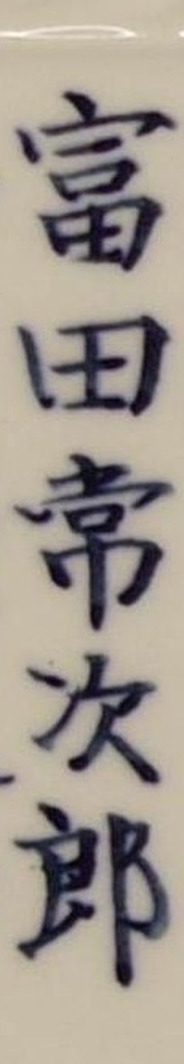富田常次郎
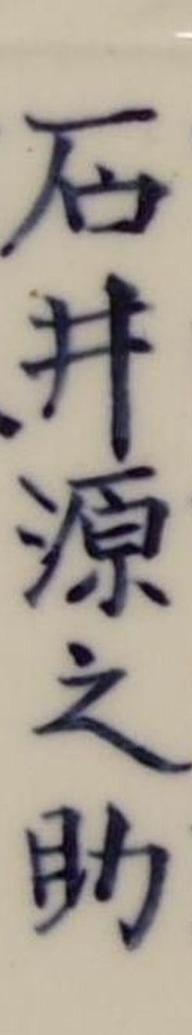石井源之助
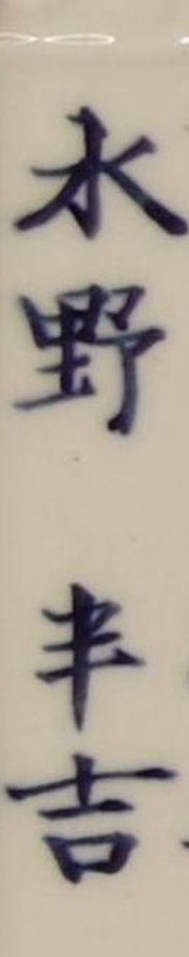水野半吉

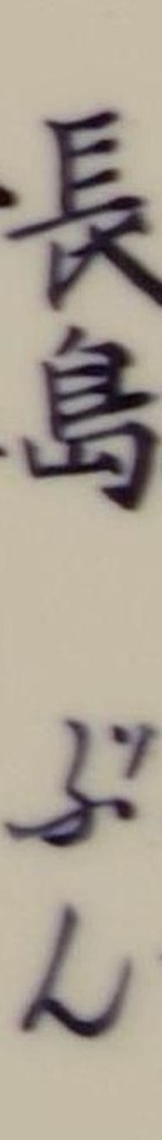長島ぶん
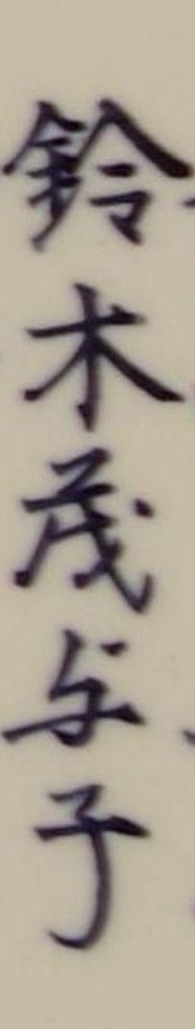鈴木茂与子
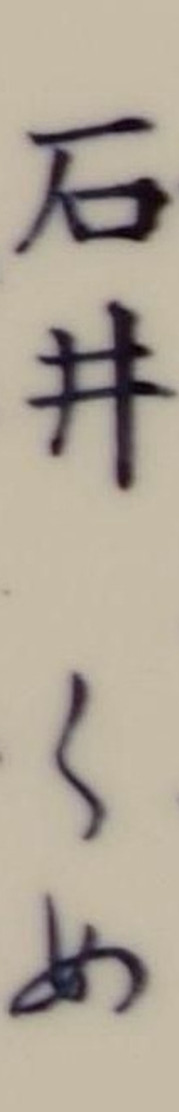石井くめ
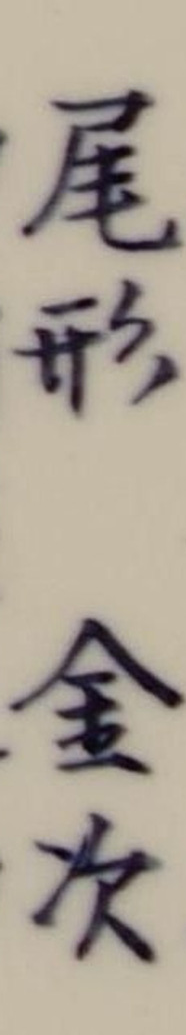尾形金次
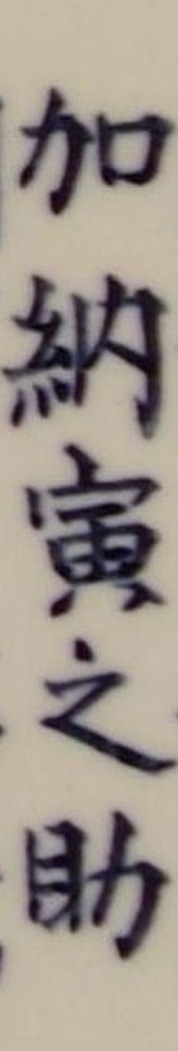加納寅之助
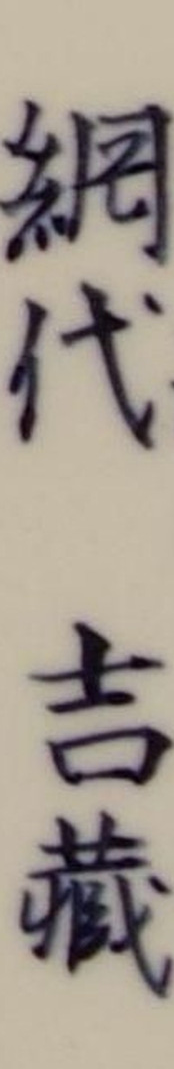網代吉蔵
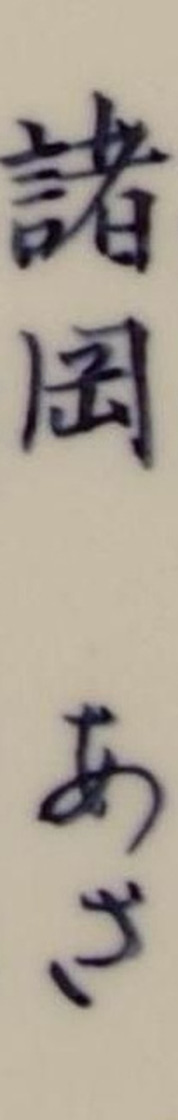諸岡あさ
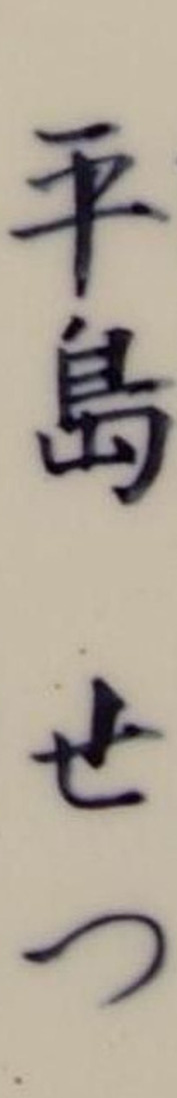平島せつ
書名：E~L
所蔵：高野山金剛峯寺
